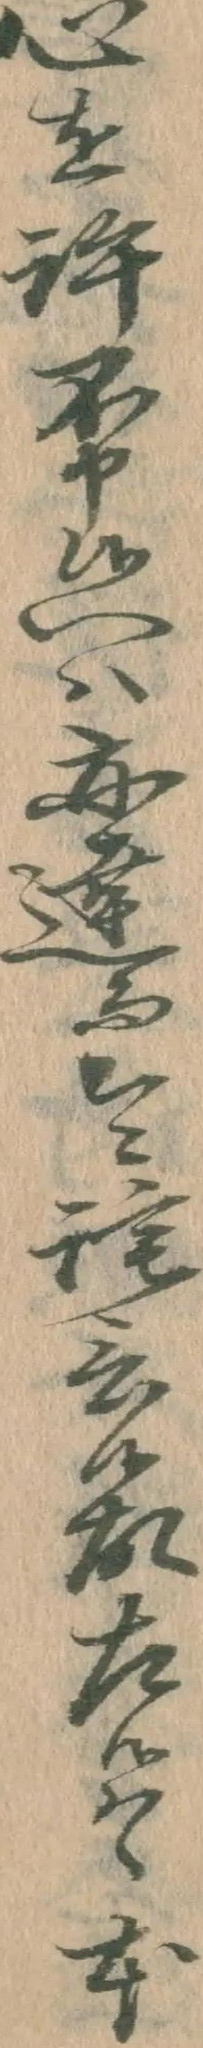心を許不申候はゝ亦達而令詫言候故左候はゝ本
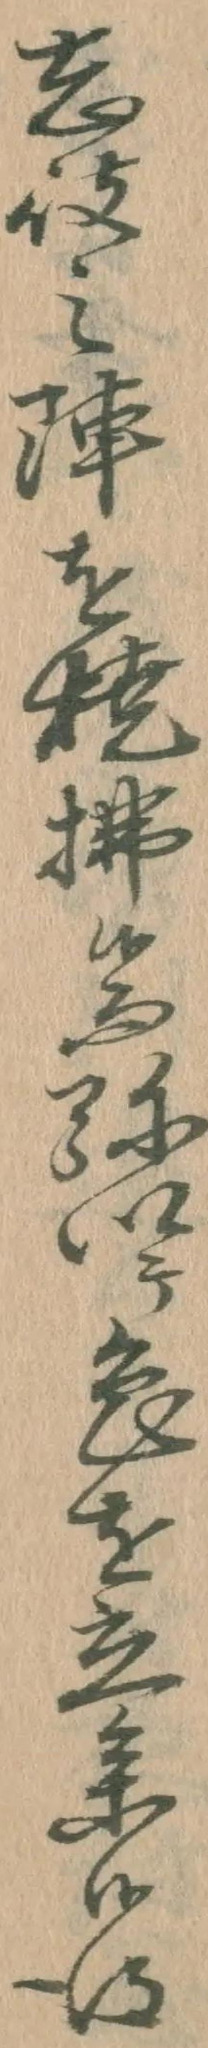志岐之陣を焼払候而弥以テ急を立参候得
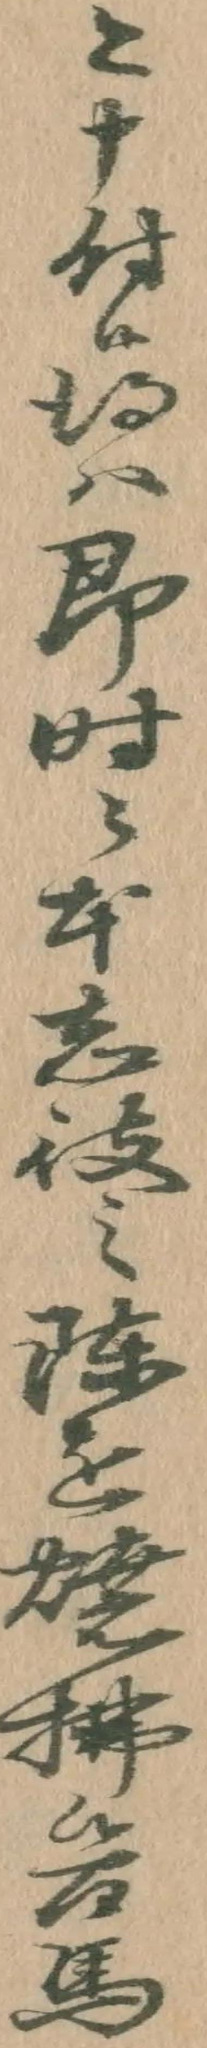と申付候得は即時に本志岐之陣を焼払候間馬
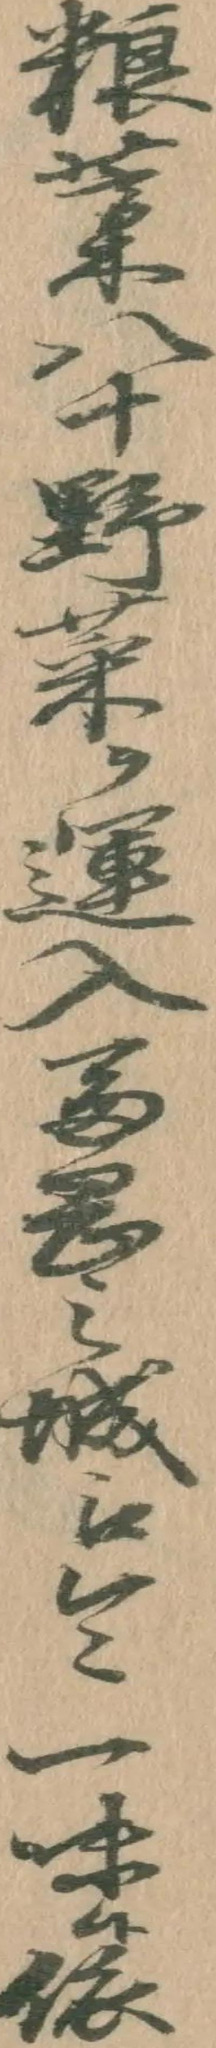粮藁八十野菜ヲ運入富岡之城江令一味候依
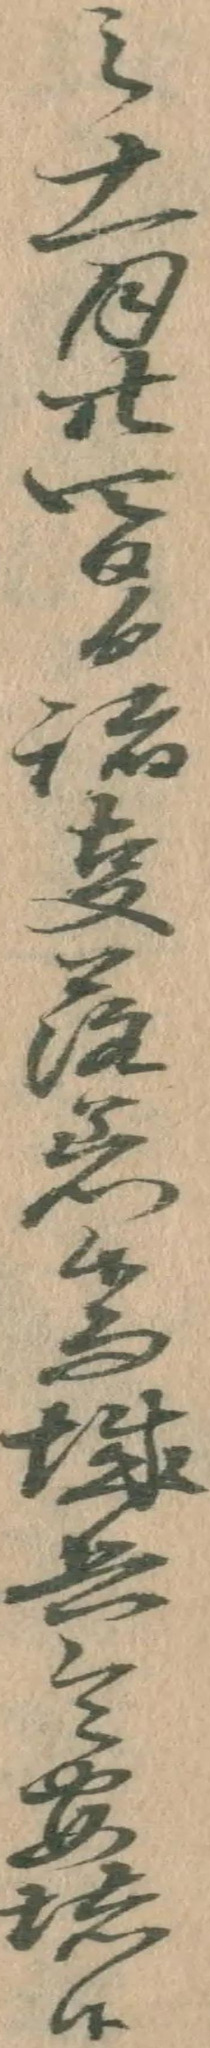之十一月廿四日ゟ諸事落着候而城兵令安堵候
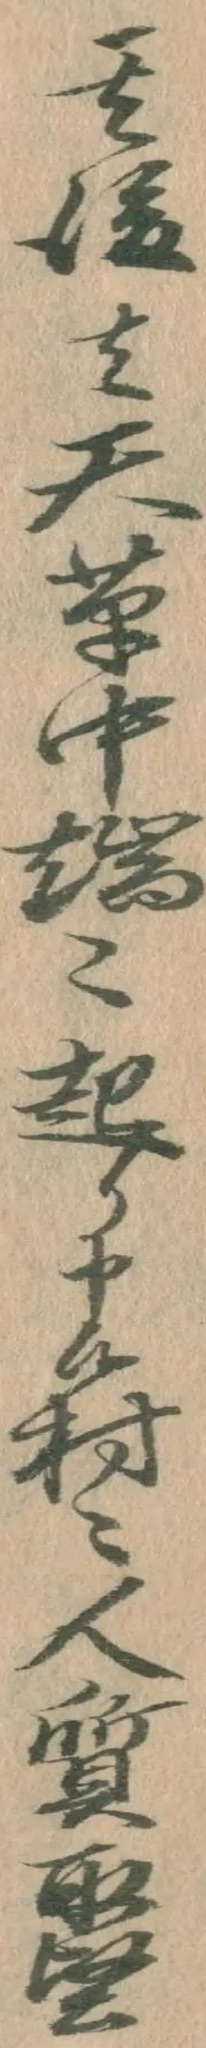其後は天草中端々起り申候村々人質取堅
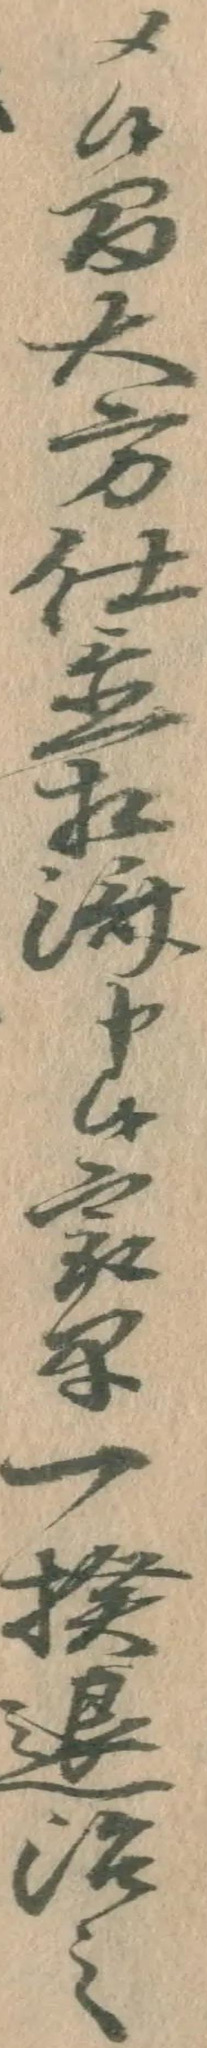メ候間大方仕置相済申候最早一揆退治之
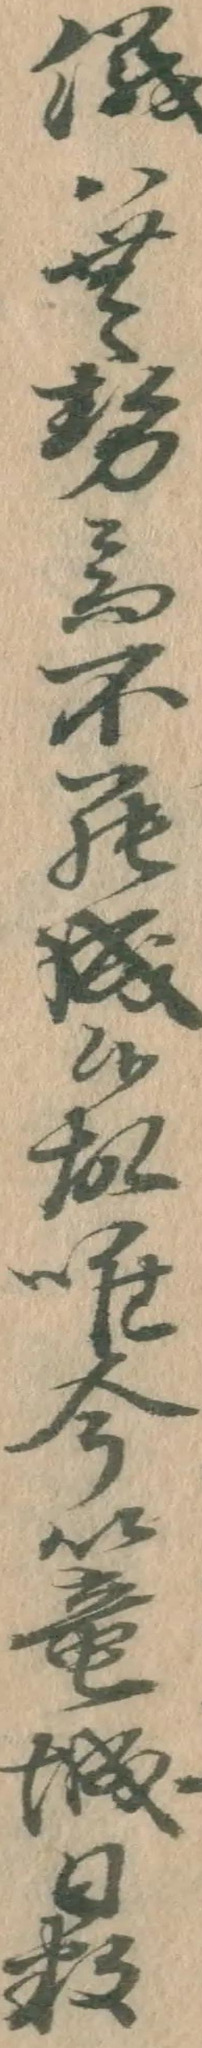儀は無勢に而不罷成候故唯今籠城日数
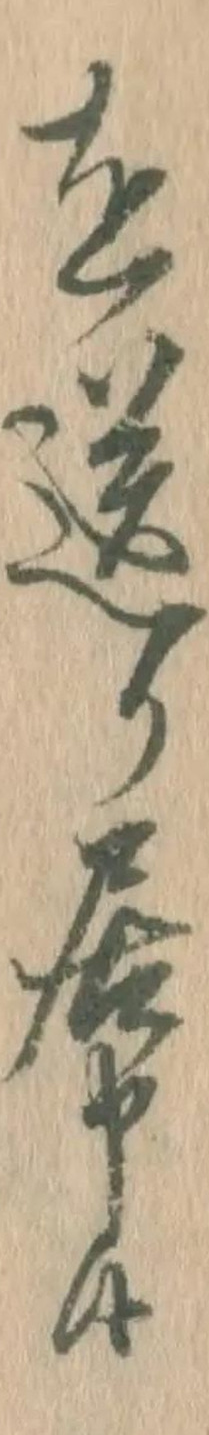を送り居申候

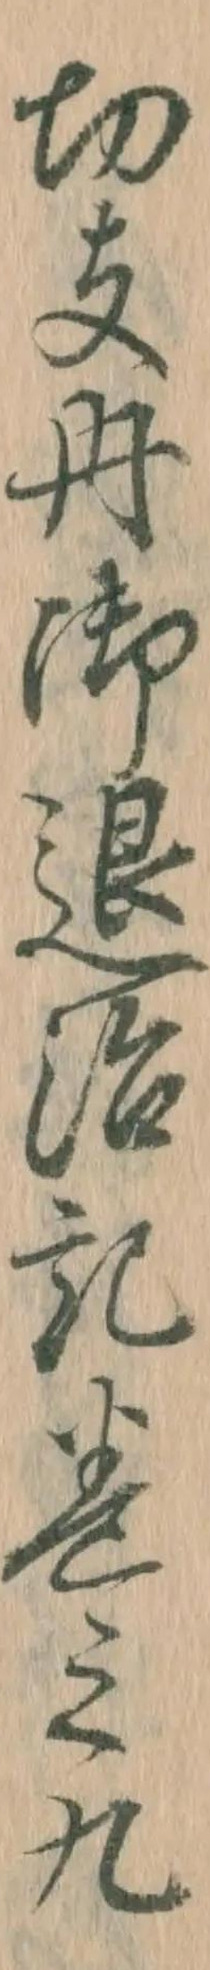切支丹御退治記巻之九
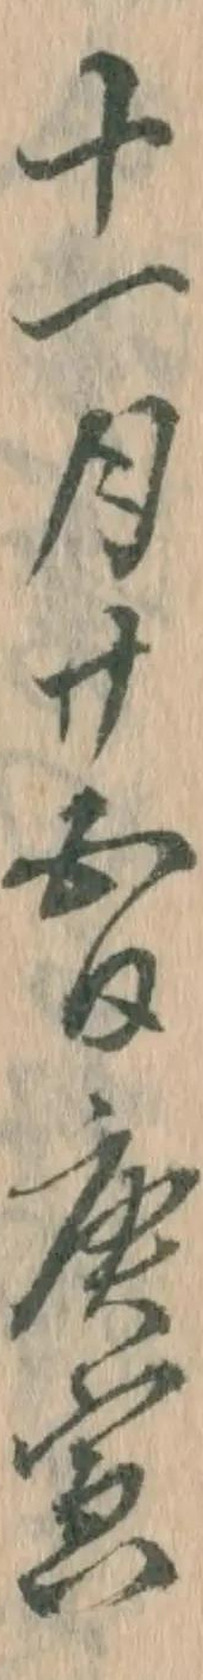十一月廿五日庚寅
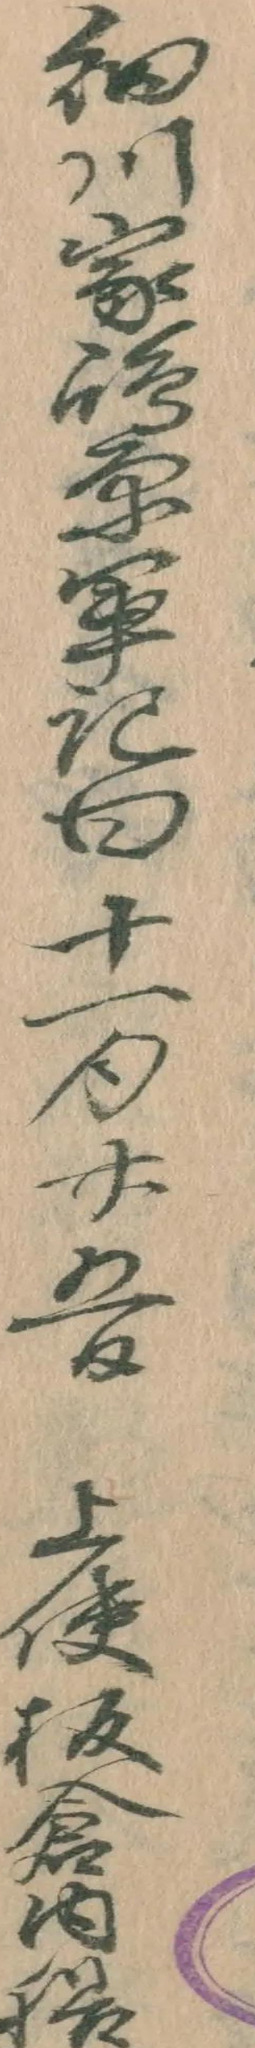細川家島原軍記曰十一月廿五日上使板倉内膳
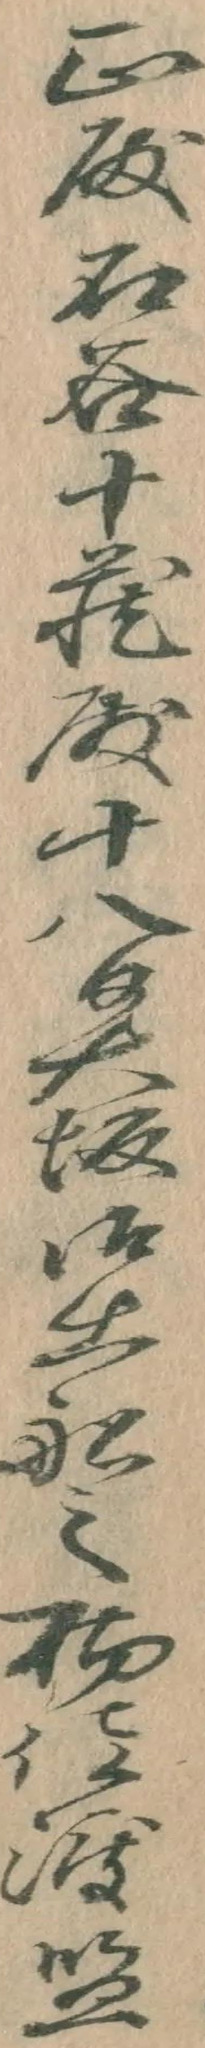正殿石谷十蔵殿十八日大坂御出船之砌佐渡監
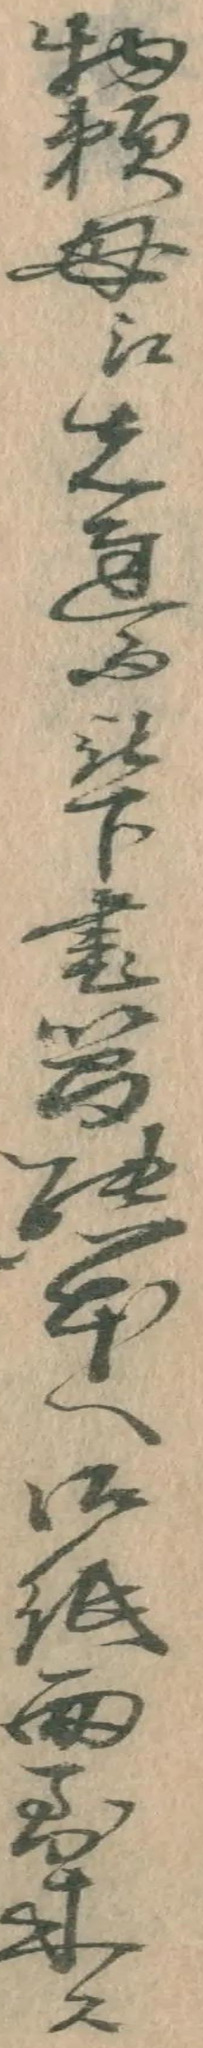物頼母江先達而被下書簡熊本へ御紙面到来ス
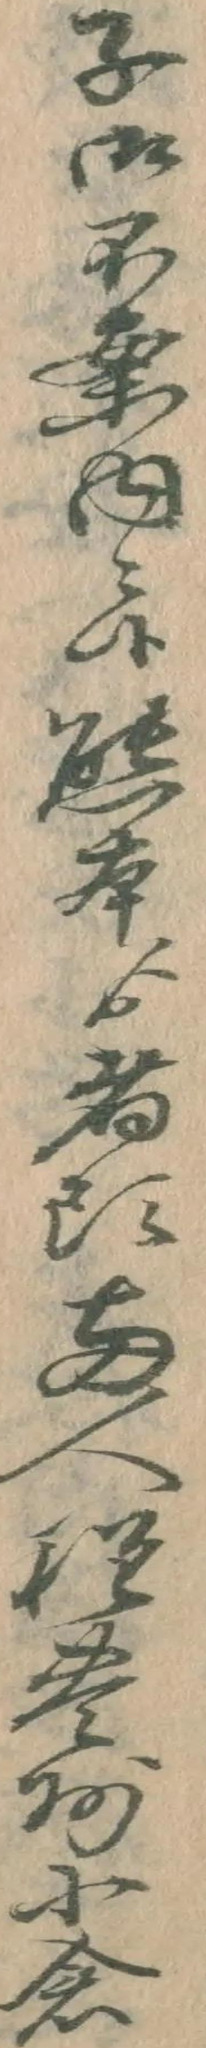子御不案内に候熊本ゟ者頭両人程豊州小倉
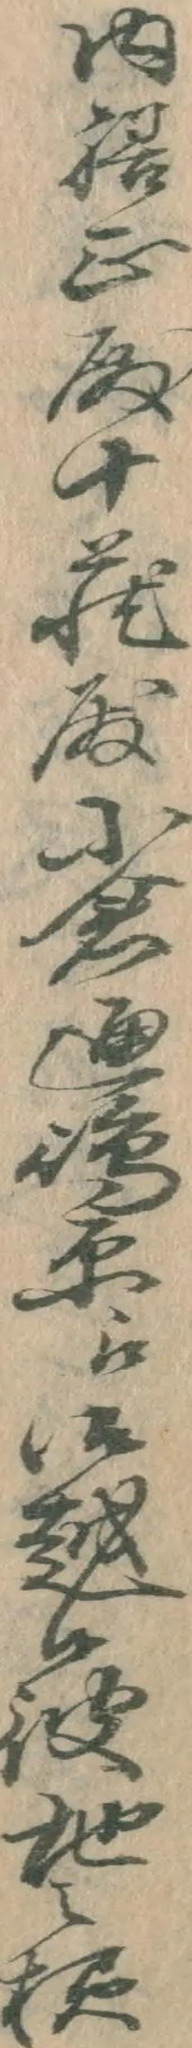内膳正殿十蔵殿小倉通島原江御越候彼地之様
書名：切支丹御退治記 49巻. [3]
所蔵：国立国会図書館 National Diet Library, JAPAN
